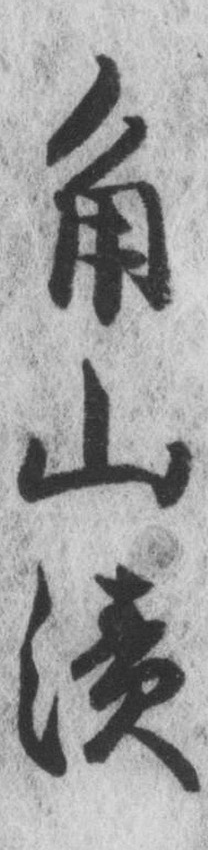角山漬
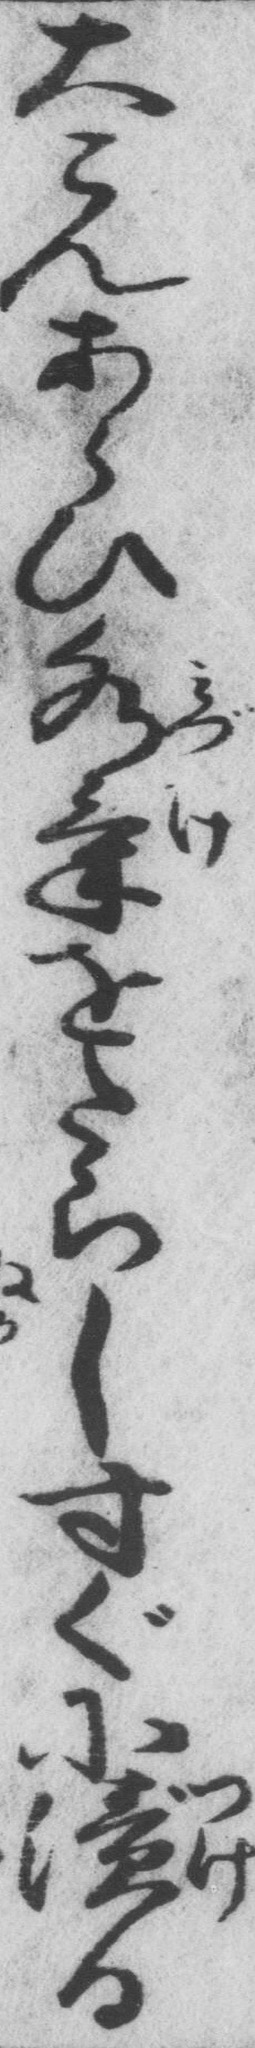大こんあらひ水気をたらしすぐに漬る
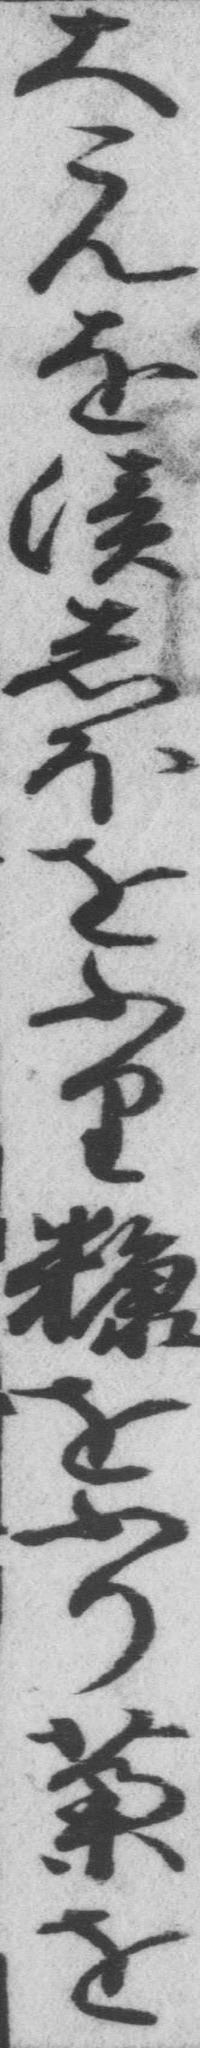大こんを漬しほをふり糠をふり藁を
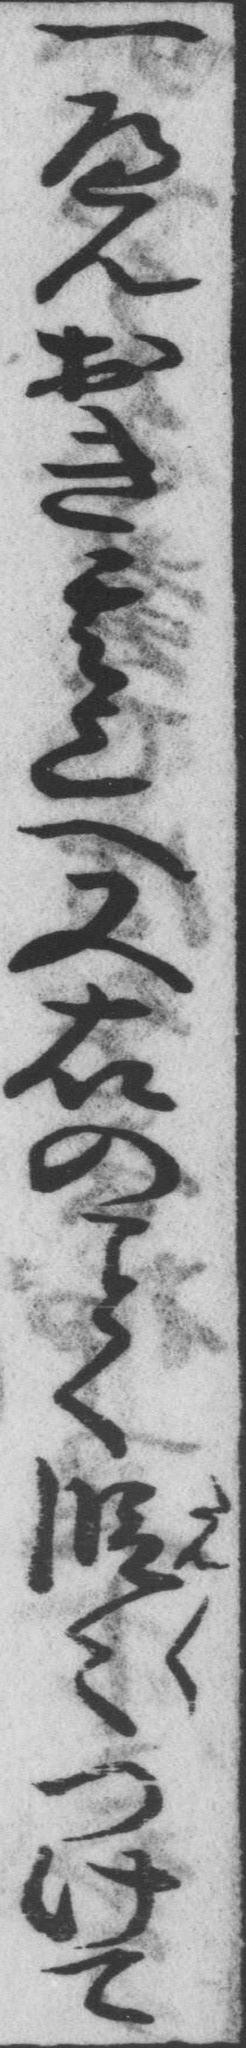一へんおき其上へ右のことく段々つけて
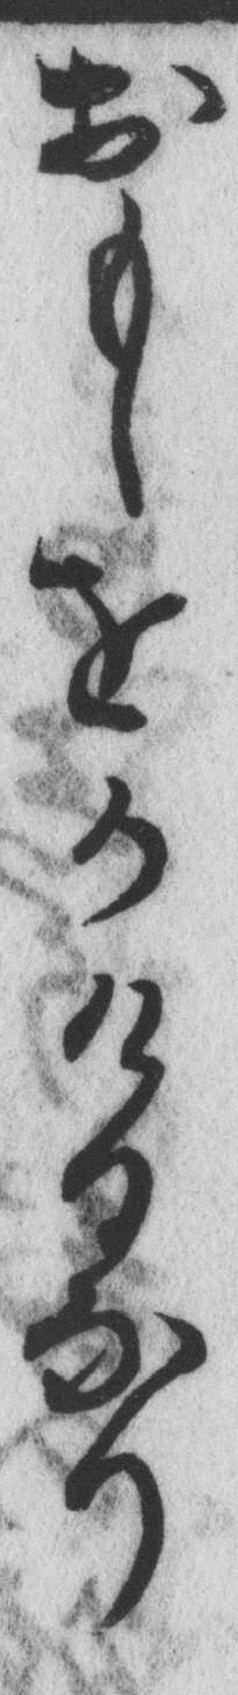おもしをかけるなり
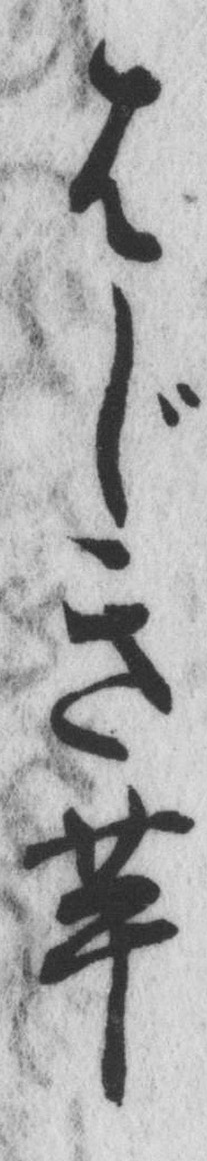はじき草
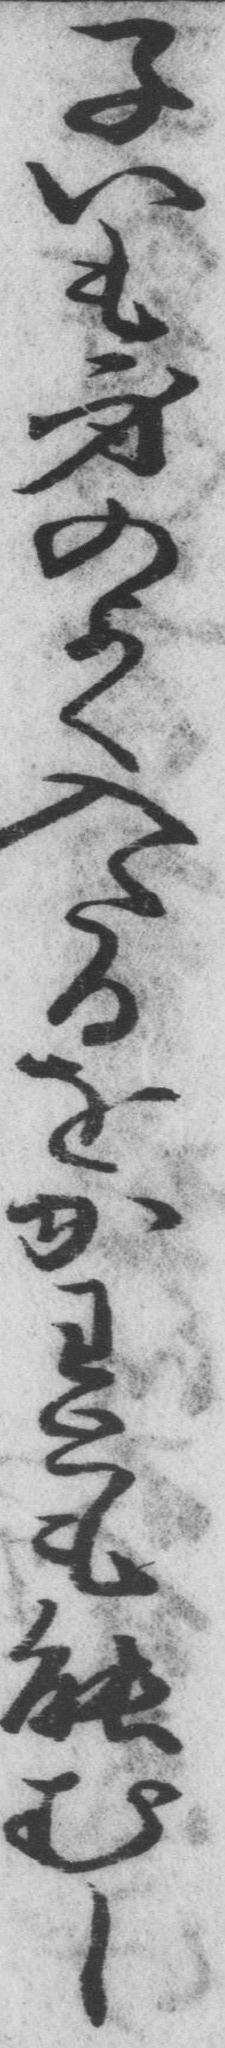子いも身のよく入たるをかわとも能むし
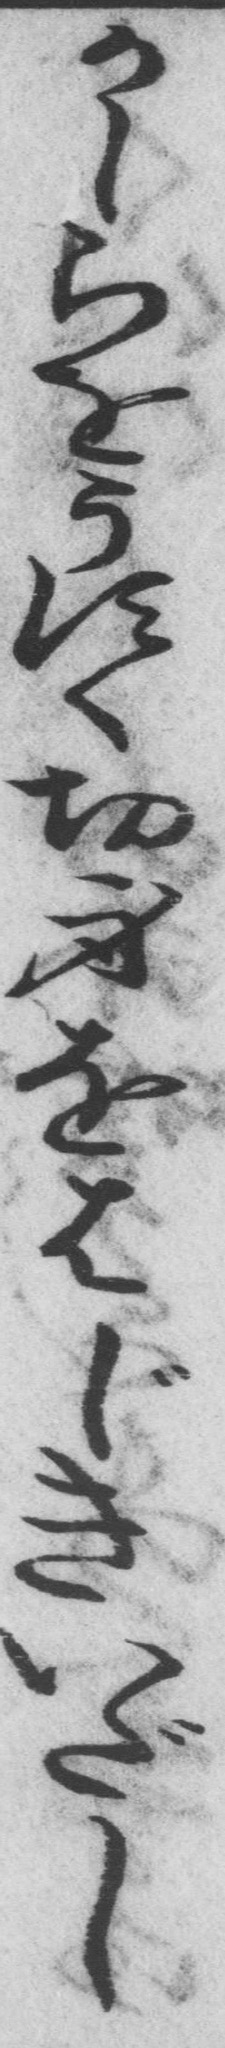かしらをうすく切身をはじきいだし
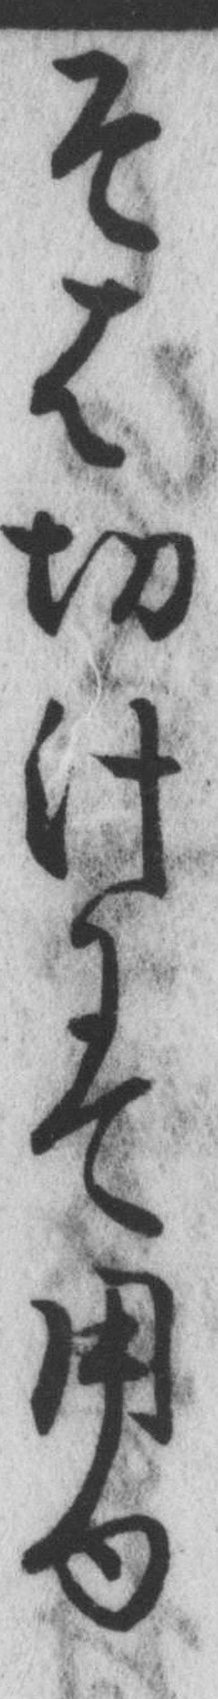そは切汁にて用ゆ
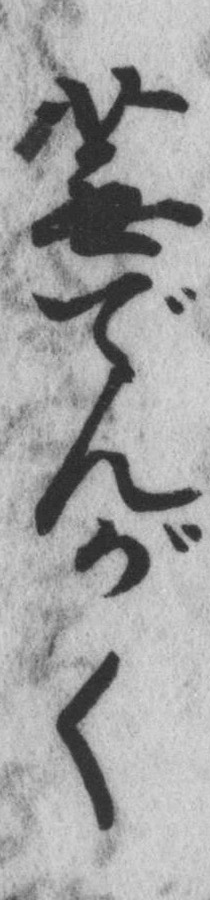蕪でんがく

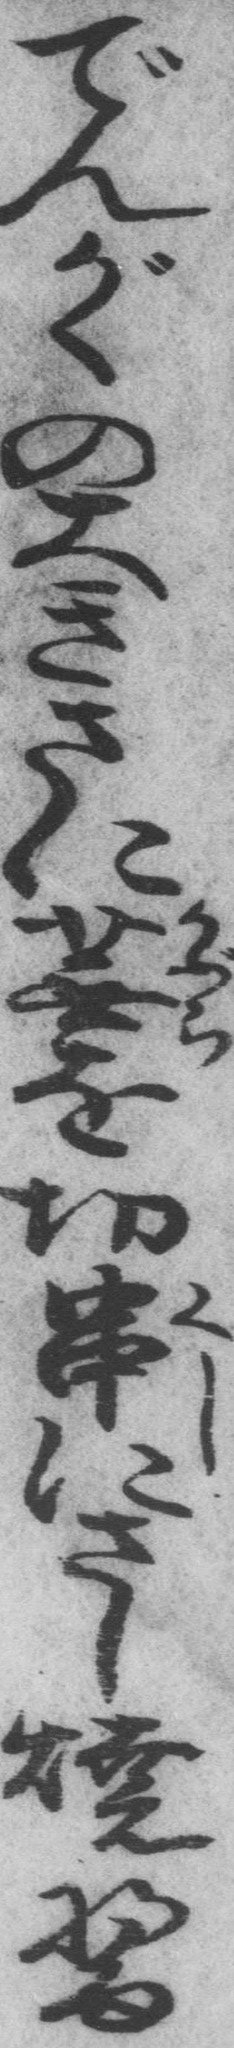でんがくの大きさに蕪を切串にさし焼醤
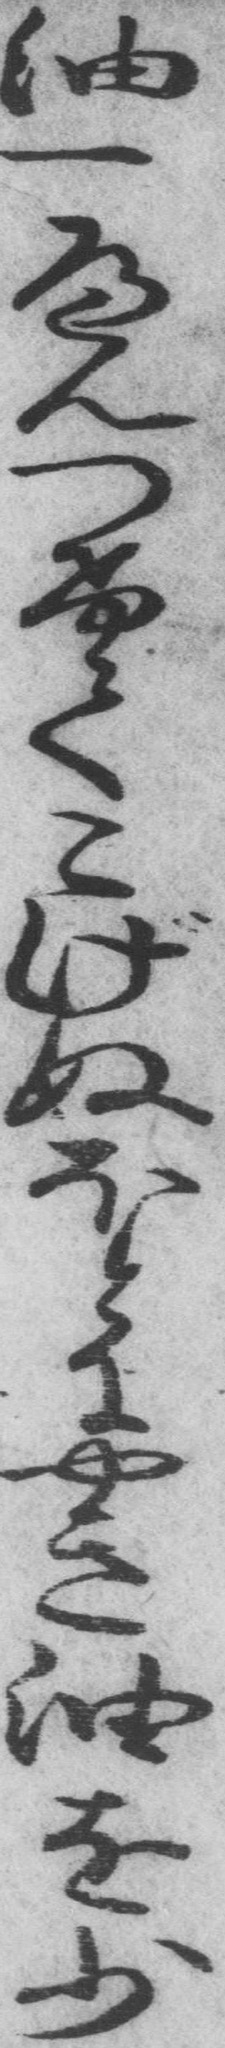油一へんつけてこげぬほとにやき油を少
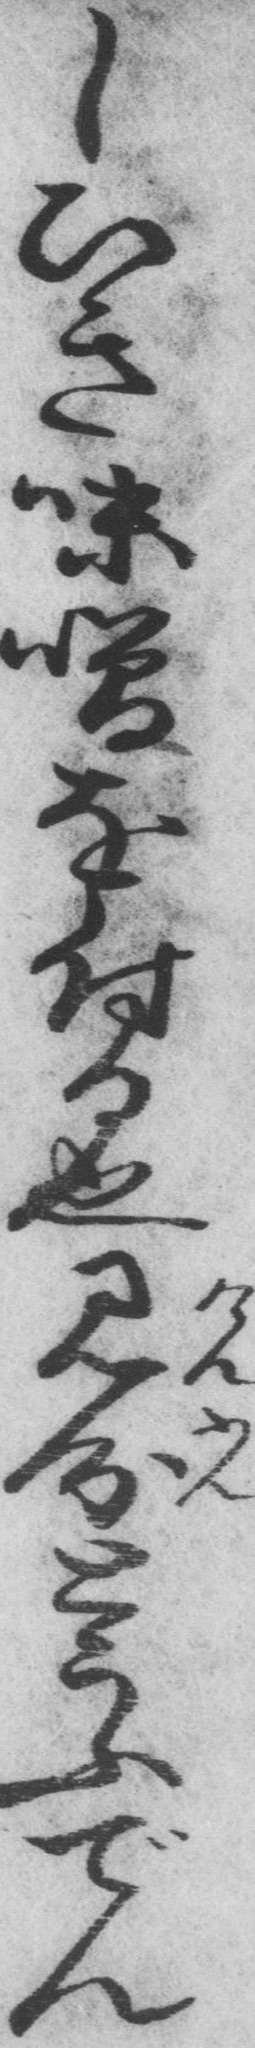しひき味噌を付る也見分とうふでん
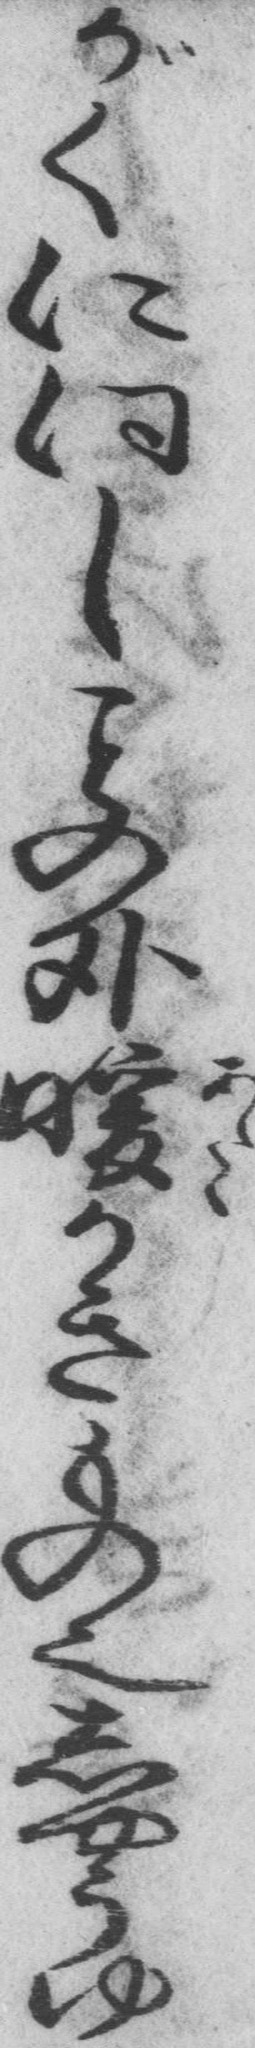がくに同しことの外暖かきもの也しやうゆ
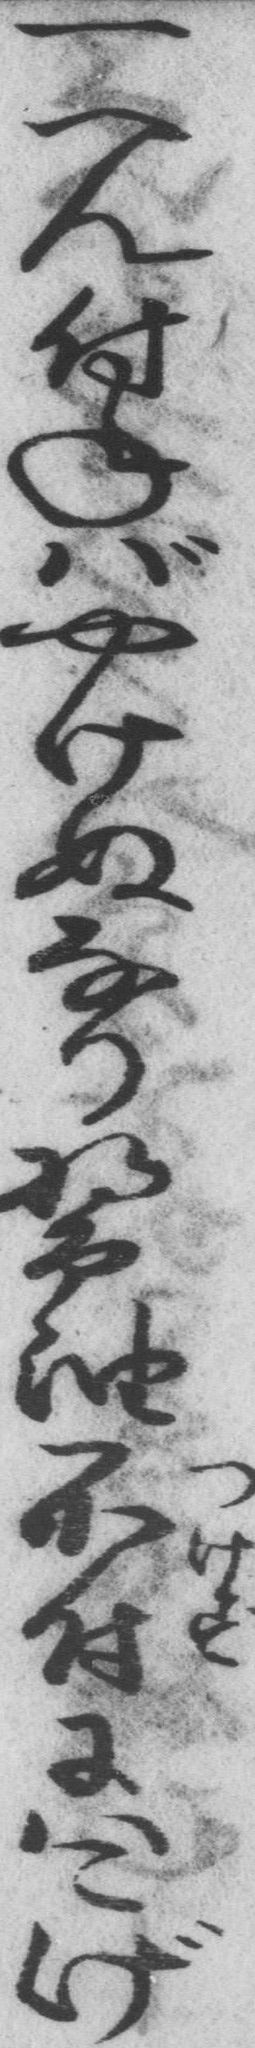一へん付ねばやけぬなり醤油不付にはこげ
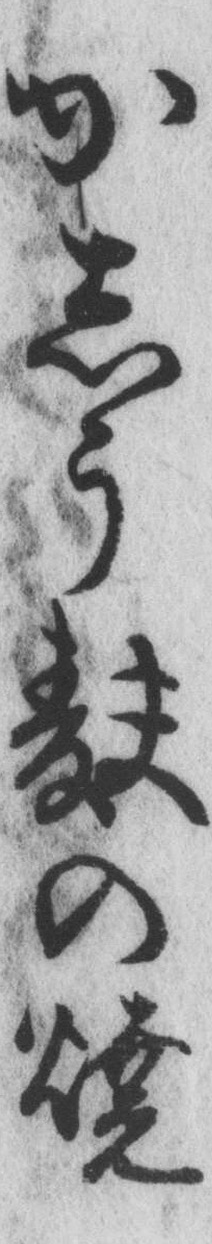かしう麩の焼
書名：料理山海郷
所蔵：大阪府立大学学術情報センター 国文学研究資料館
